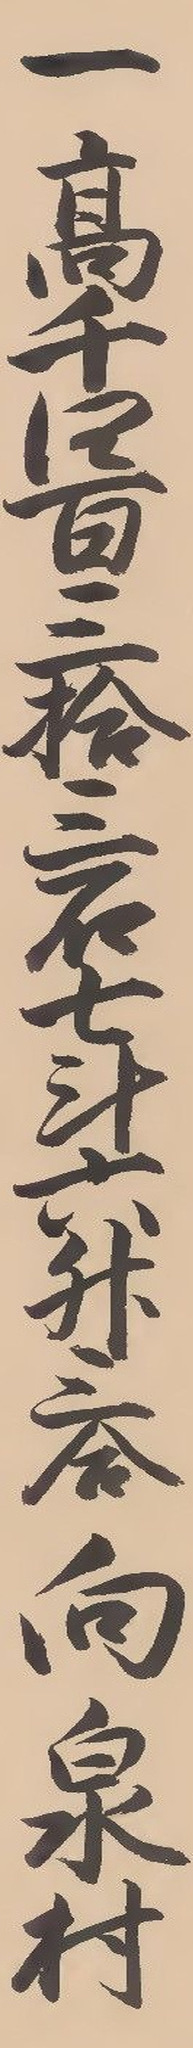一高千四百三拾三石七斗六升三合向泉村
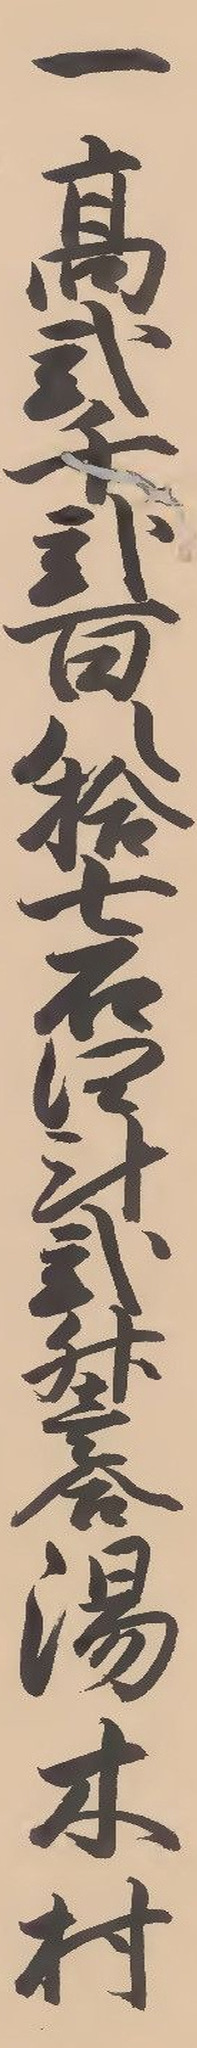一高弐千弐百八拾七石四斗弐升壱合湯木村
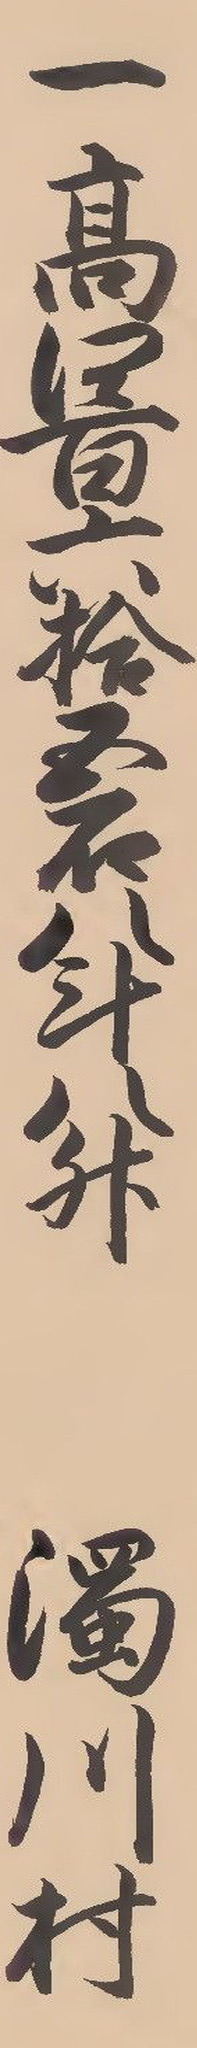一高四百六拾五石八斗八升濁川村
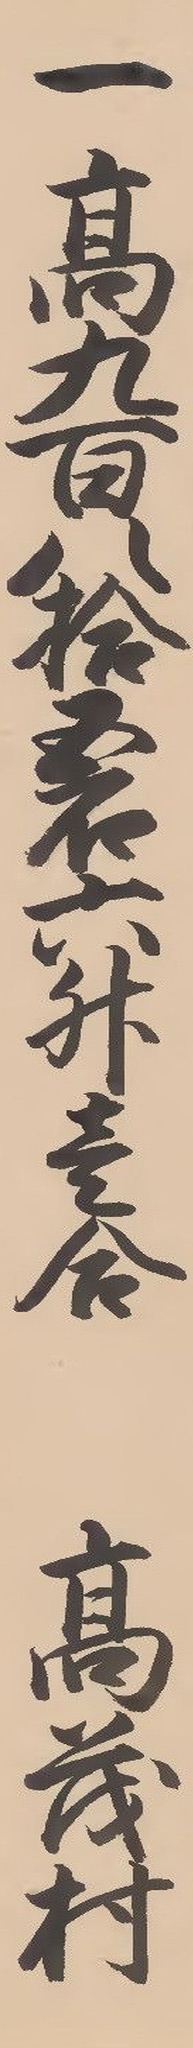一高九百八拾五石六升壱合高茂村
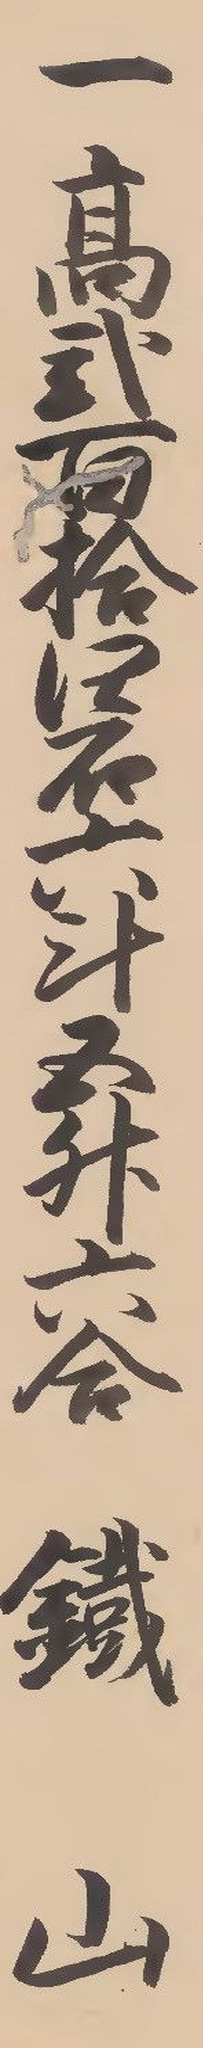一高弐百拾四石六斗五升六合鉄山
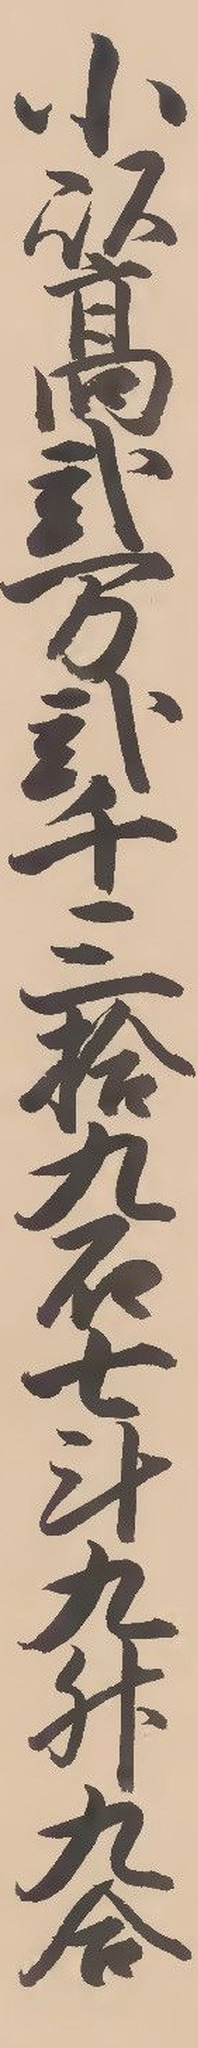小以高弐万弐千三拾九石七斗九升九合

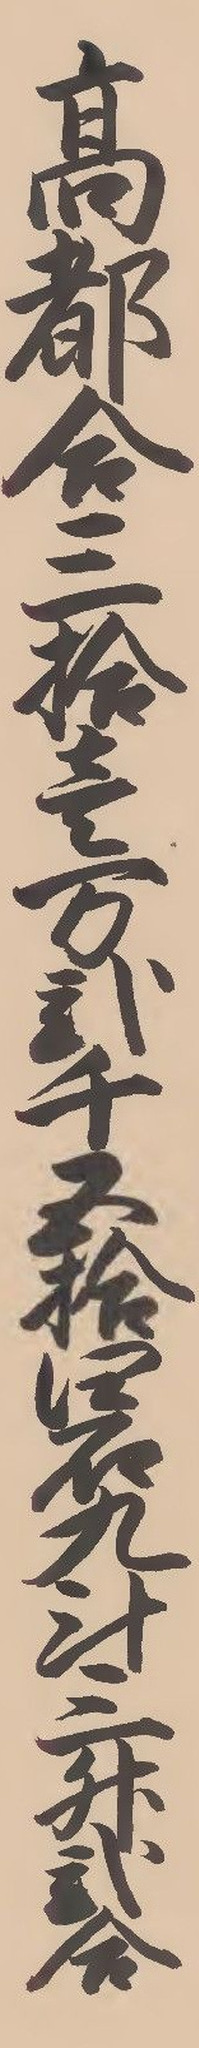高都合三拾壱万弐千五拾四石九斗三升弐合
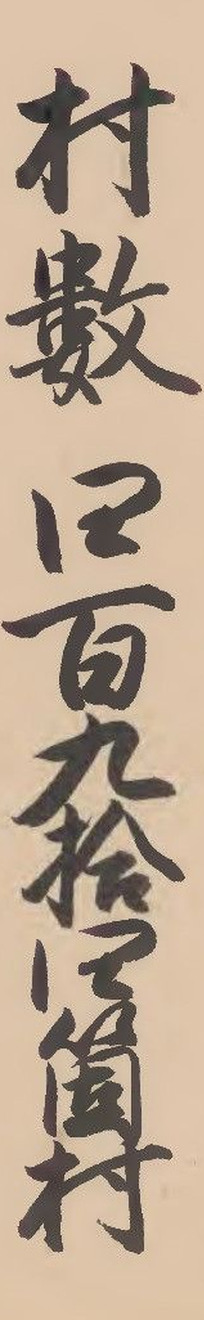村数四百九拾四箇村
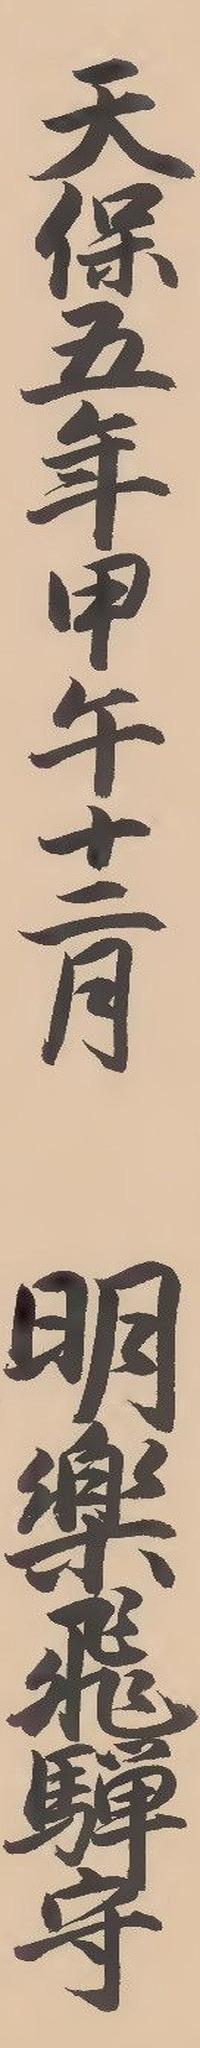天保五年甲午十二月明楽飛騨守
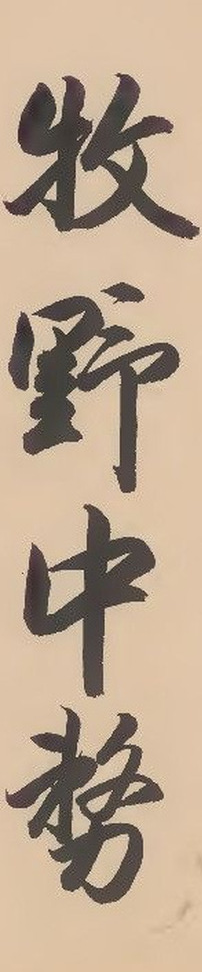牧野中務
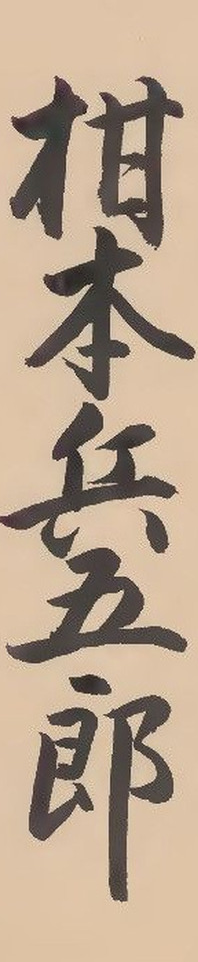柑本兵五郎
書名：備後国郷帳
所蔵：国立公文書館 National Archives of Japan
